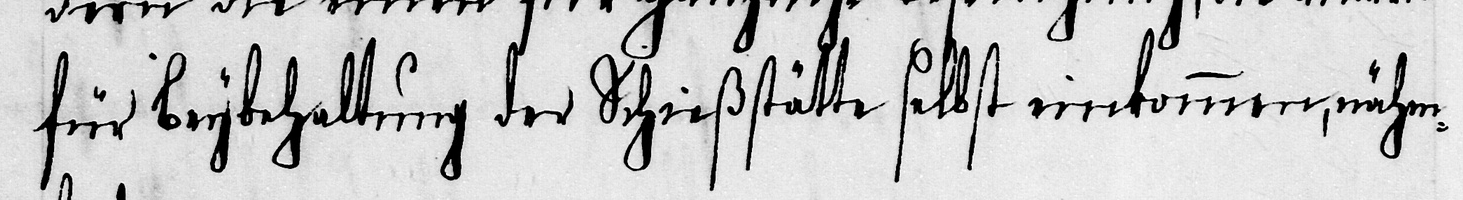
für Beybehaltung der Schießstätte selbst einkommen, nähm¬
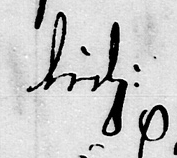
lich:
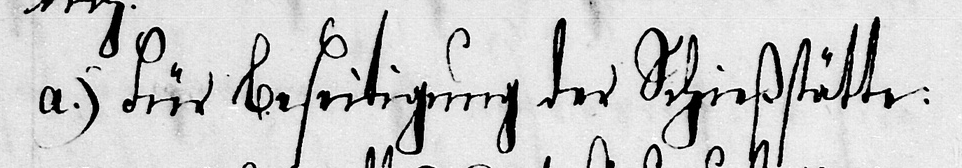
a.) Für Beseitigung der Schießstätte:
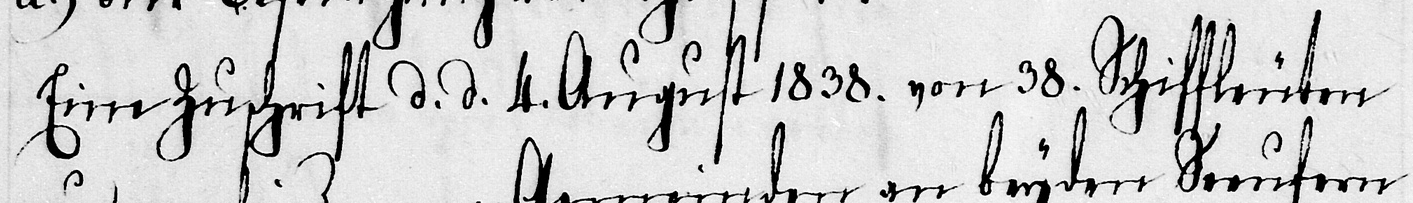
Eine Zuschrift d. d. 4. August 1838. von 38. Schiffleuten
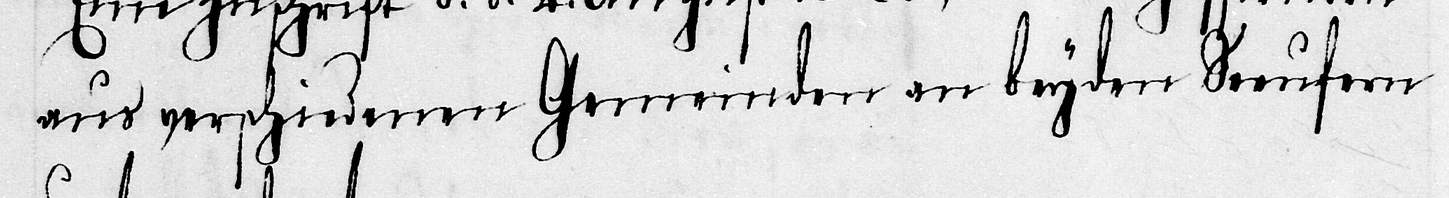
aus verschiedenen Gemeinden an beyden Seeufern
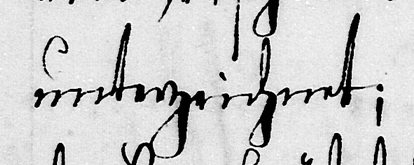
unterzeichnet;
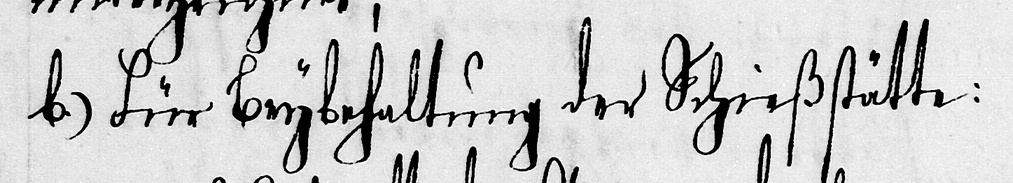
b.) Für Beyhaltung der Schießstätte
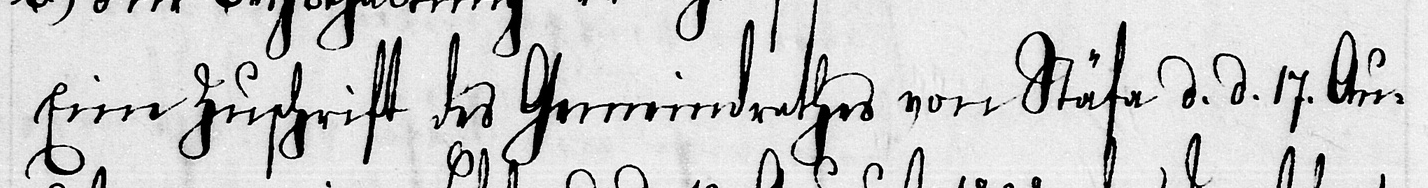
Eine Zuschrift des Gemeindrathes von Stäfa d. d. 17. Au¬
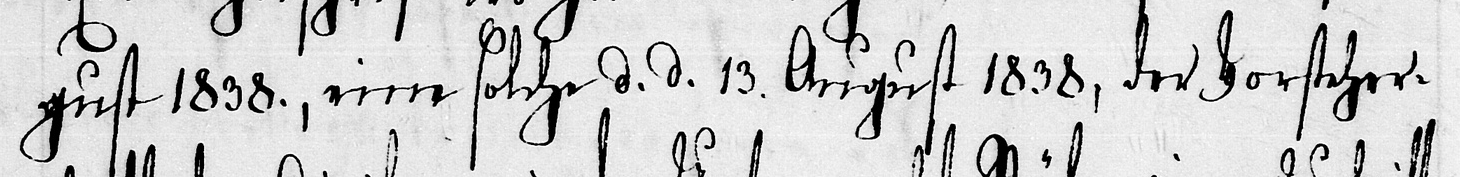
gust 1838., eine solche d. d. 13. August 1838, der Vorsteher¬
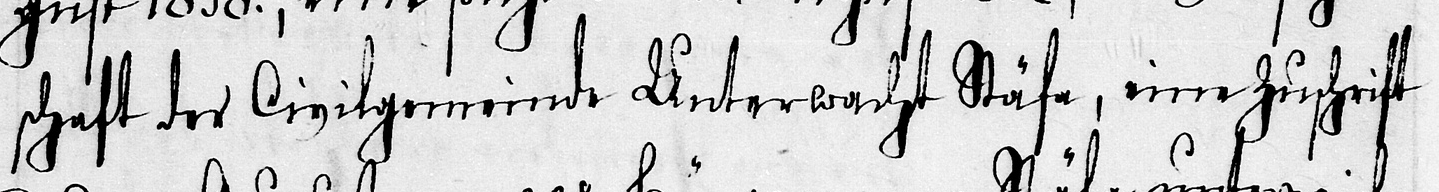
schaft der Civilgemeinde Unterwacht Stäfa, eine Zuschrift
